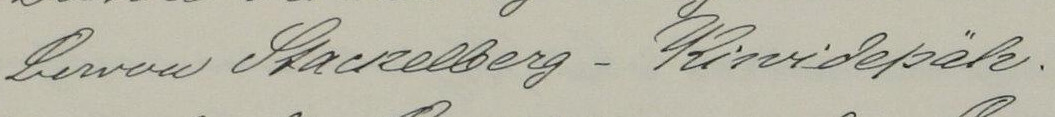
Baron Stackelberg-Kiwidepäh.
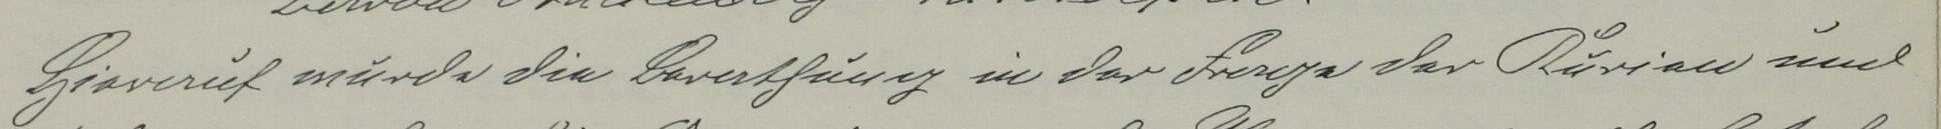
Hierauf wurde die Berathung in der Frage der Kurien und
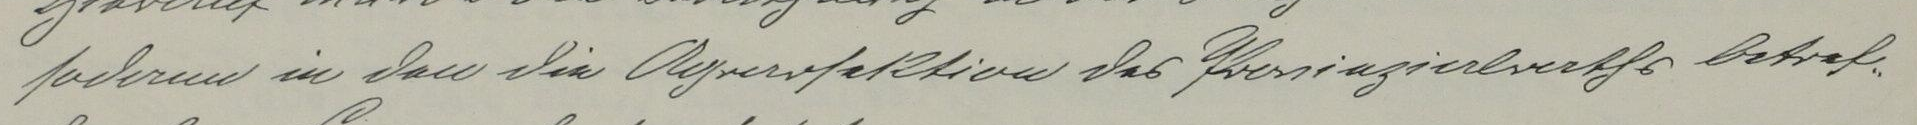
sodann in den die Agrarsektion des Provinzialraths betref-
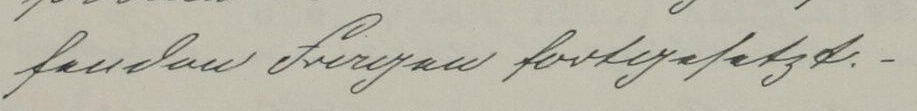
fenden Fragen fortgesetzt.
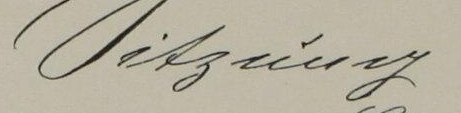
Sitzung
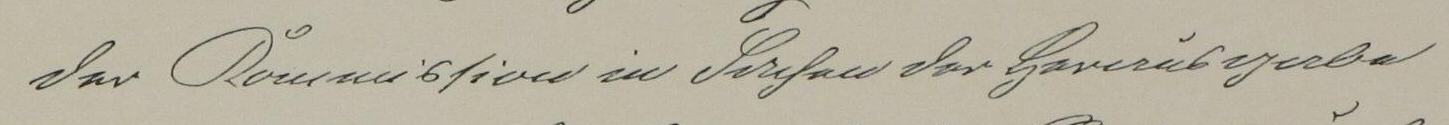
der Kommission in Sachen der Herausgabe
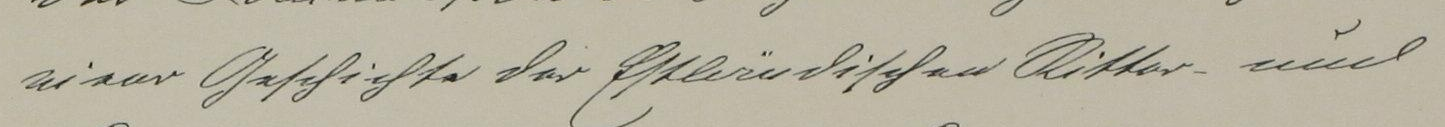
einer Geschichte der Estländischen Ritter- und
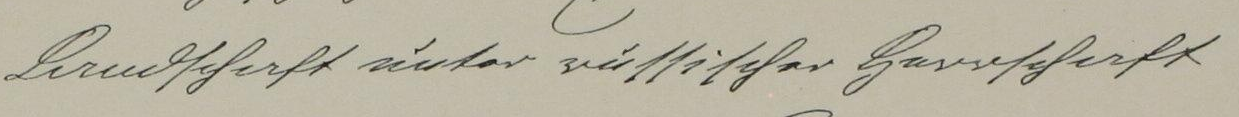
Landschaft unter russischer Herrschaft
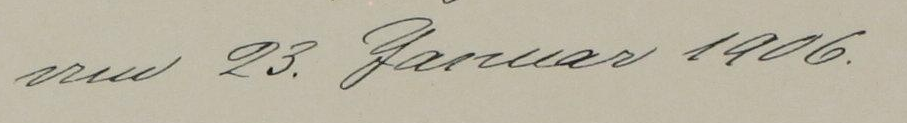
am 23. Januar 1906.
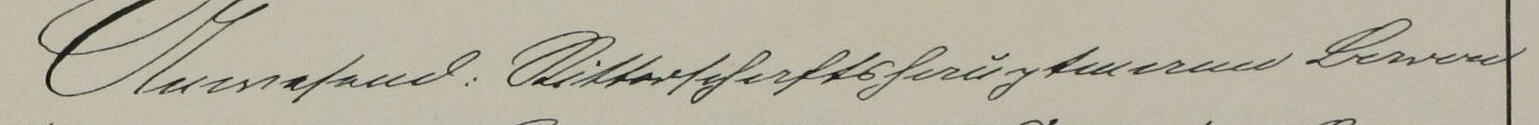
Anwesend: Ritterschaftshauptmann Baron
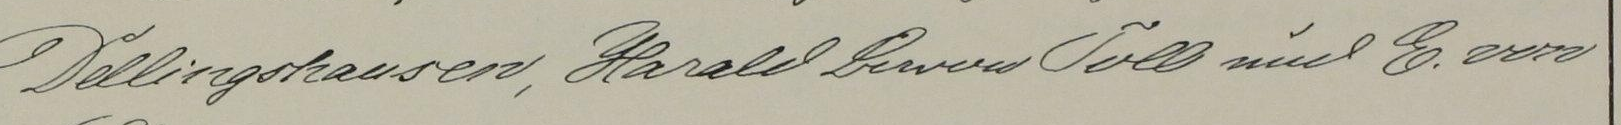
Dellingshausen, Harald Baron Toll und E. von
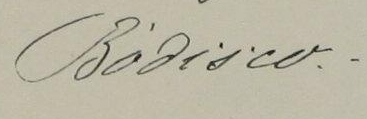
Bodisco.
